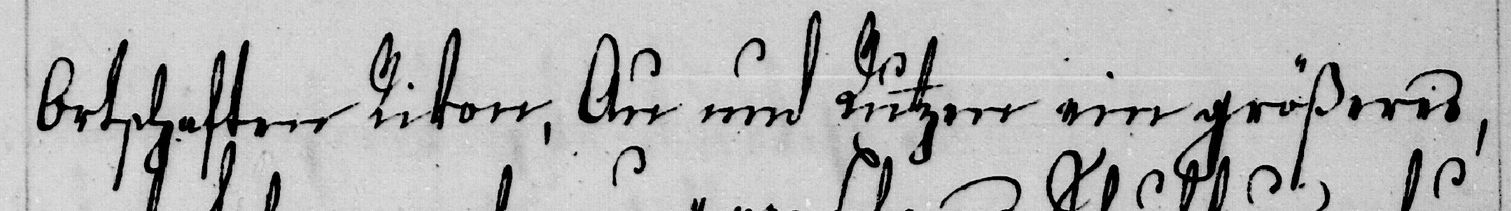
Ortschaften Rikon, Au und Rutzen ein größeres,
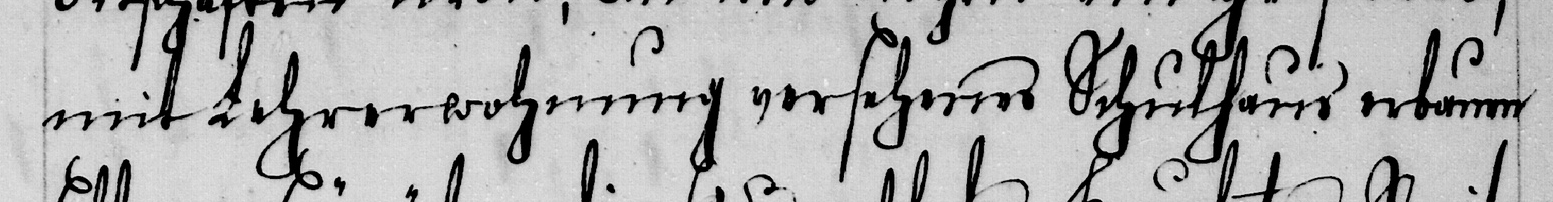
mit Lehrerwohnungen versehenes Schulhaus erbauen
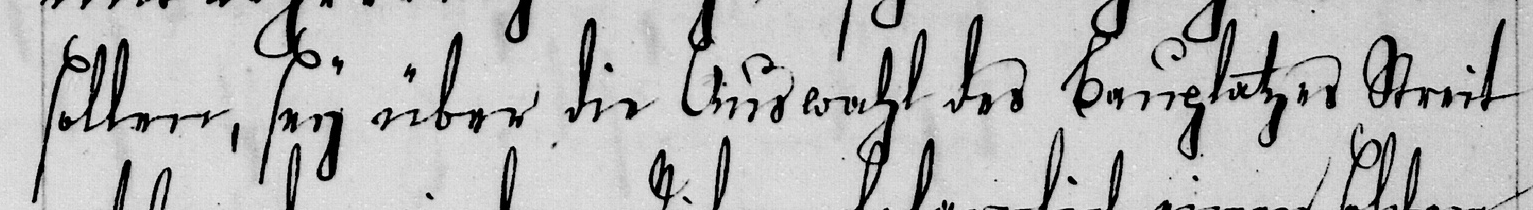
sollen, sey über die Auswahl des Bauplatzes Streit
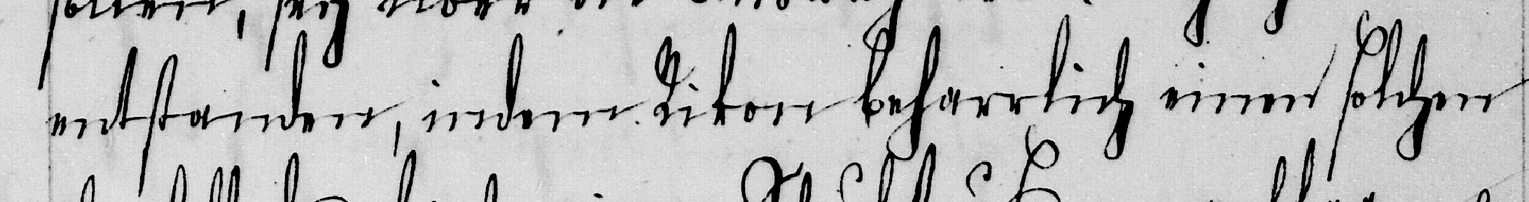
entstanden, indem Rikon beharrlich einen solchen
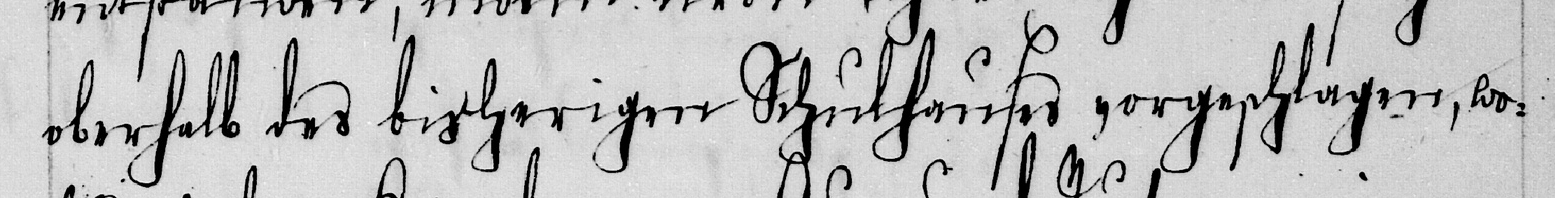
oberhalt des bisherigen Schulhauses vorgeschlagen, wo¬
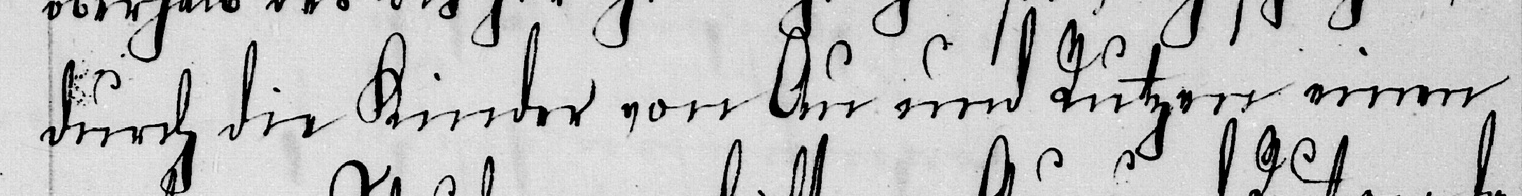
durch die Kinder von Au und Rutzen einen
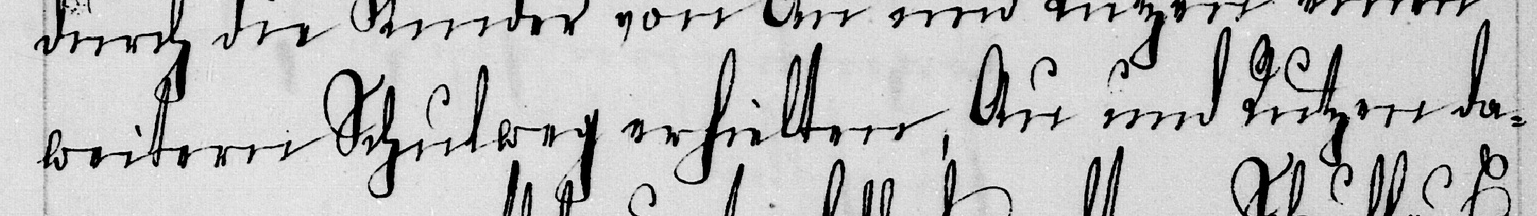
weitern Schulweg erhielten, Au und Rutzen da¬
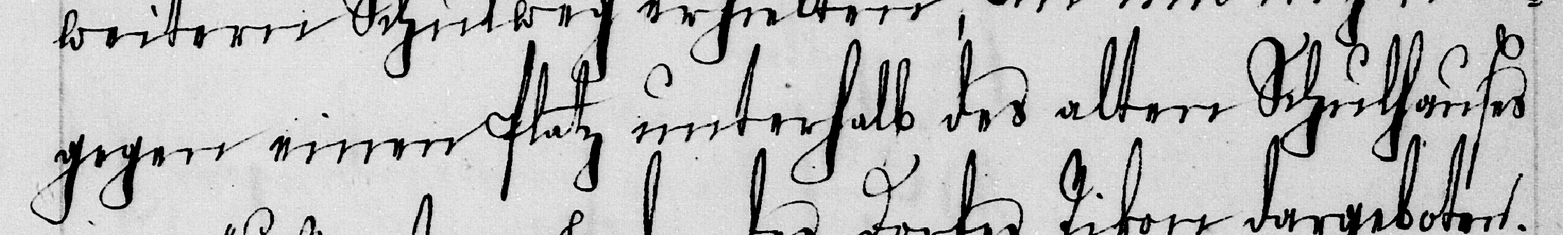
gegen einen Platz unterhalb des alten Schulhauses
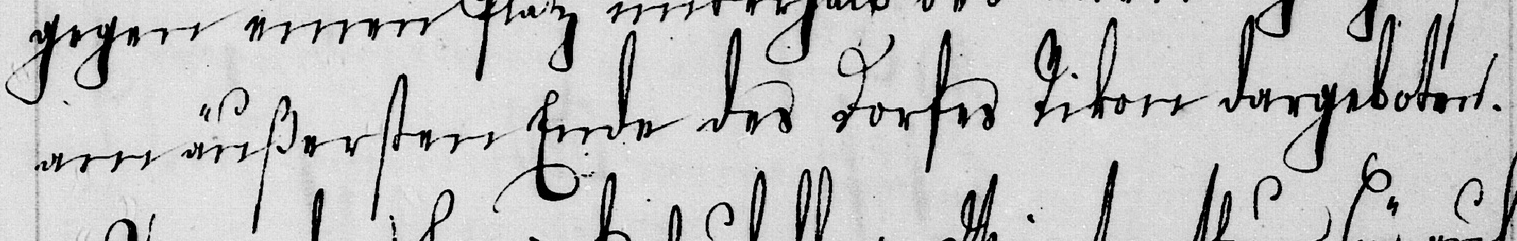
am äußersten Ende des Dorfes Rikon dargeboten.
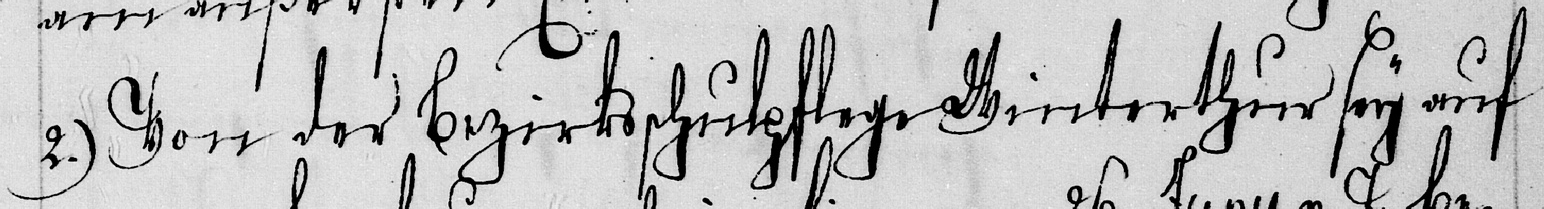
2.) Von der Bezirksschulpflege Winterthur sey auf
